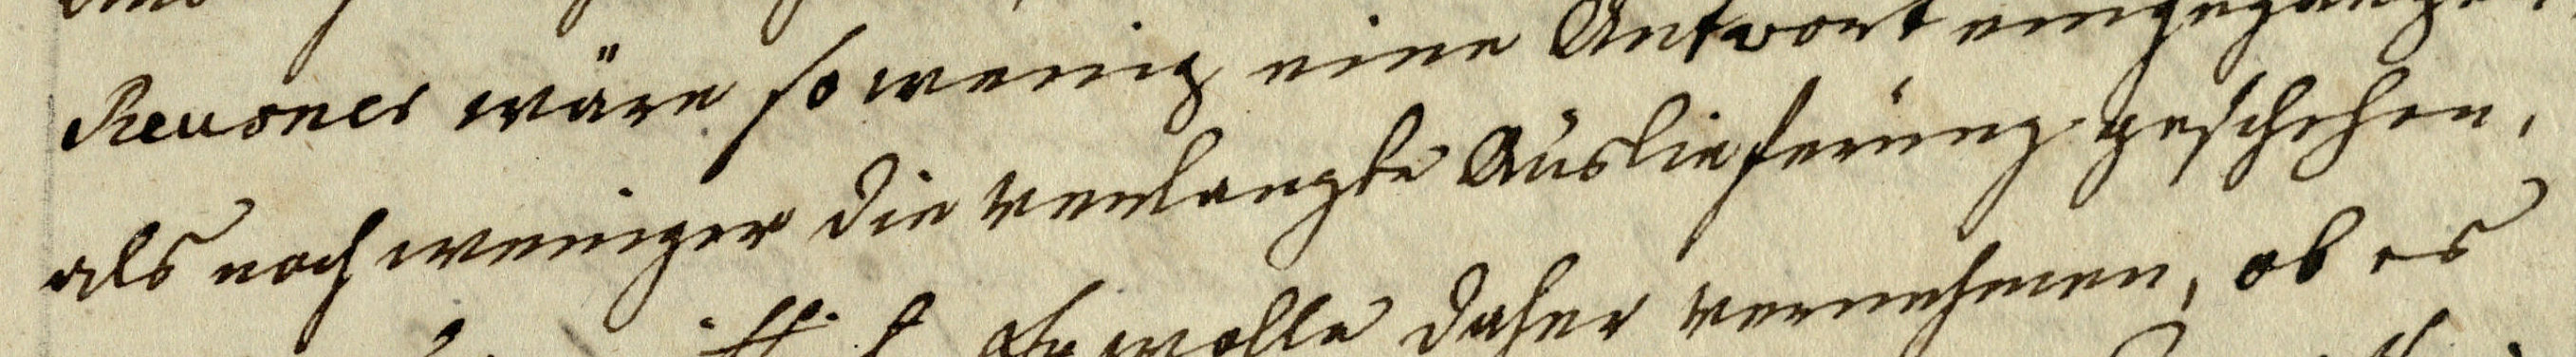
als noch weniger die verlangte Auslieferung geschehen,
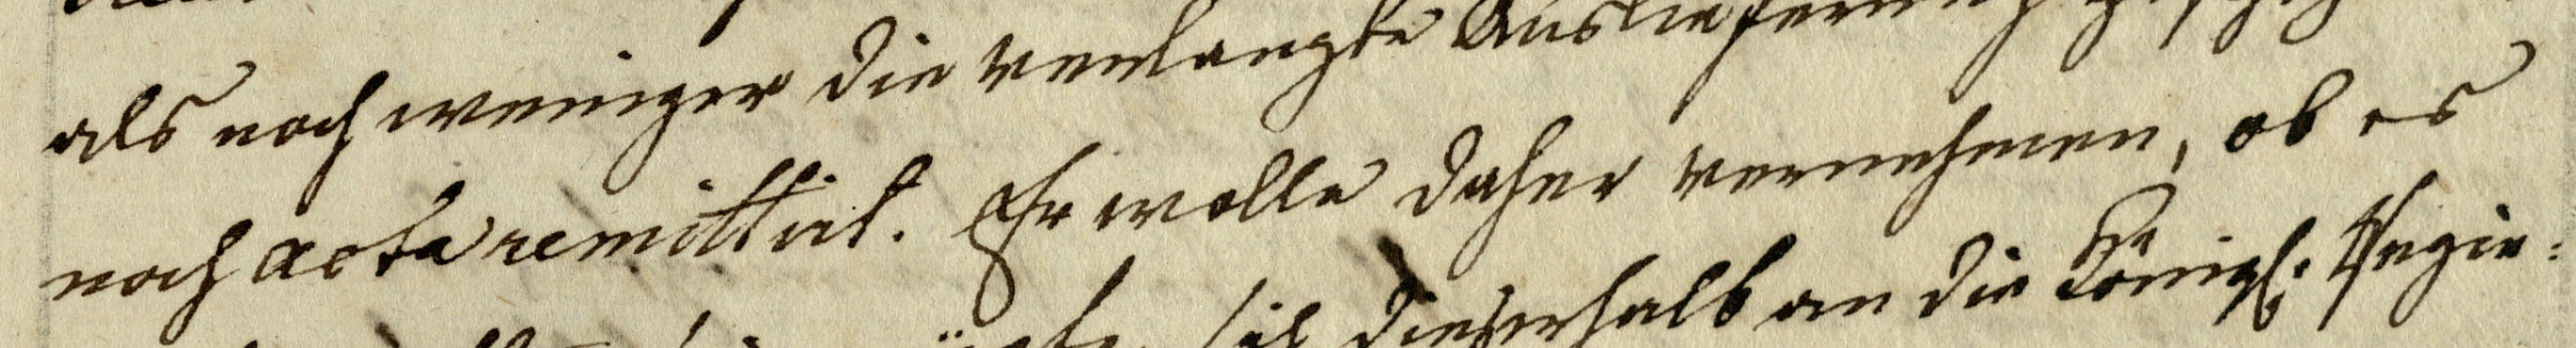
nach Acta remittirt. Er wolle daher vernehmen, ob es
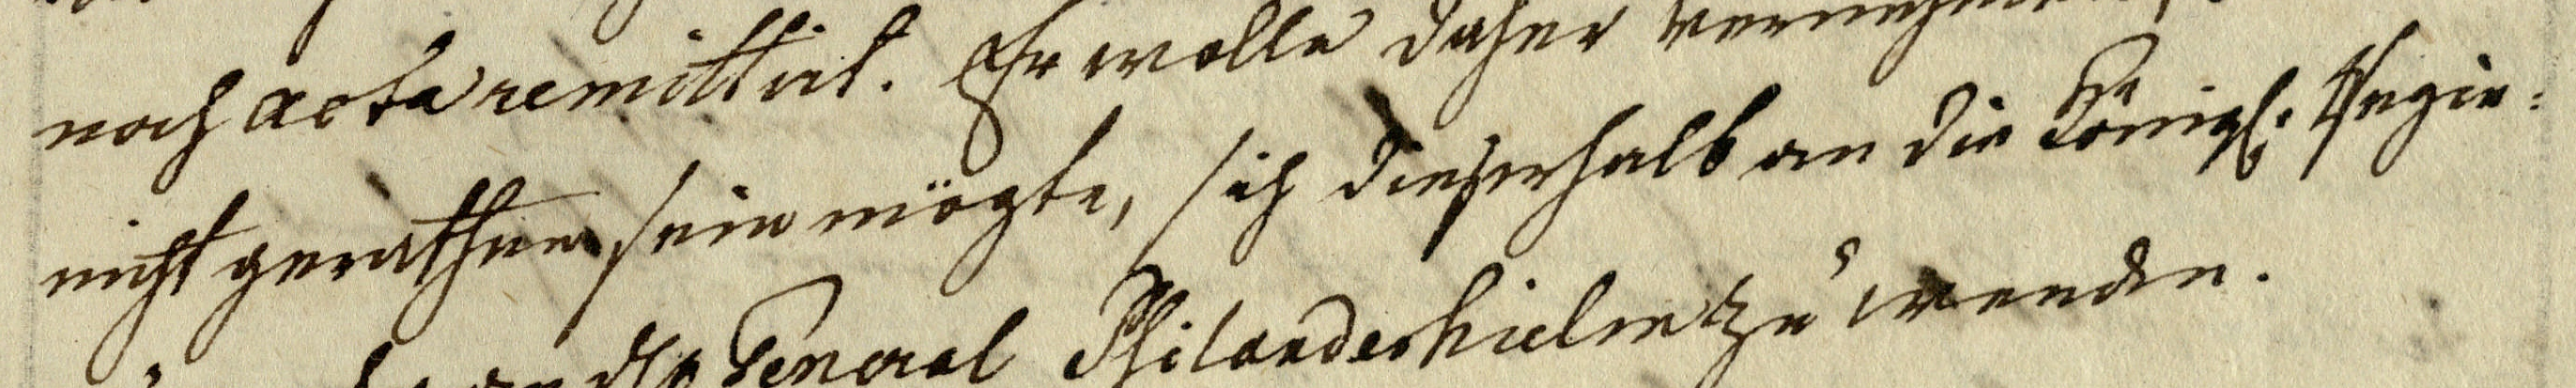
nicht gerathen sein mögte, sich dieserhalb an die Königl. Regie¬
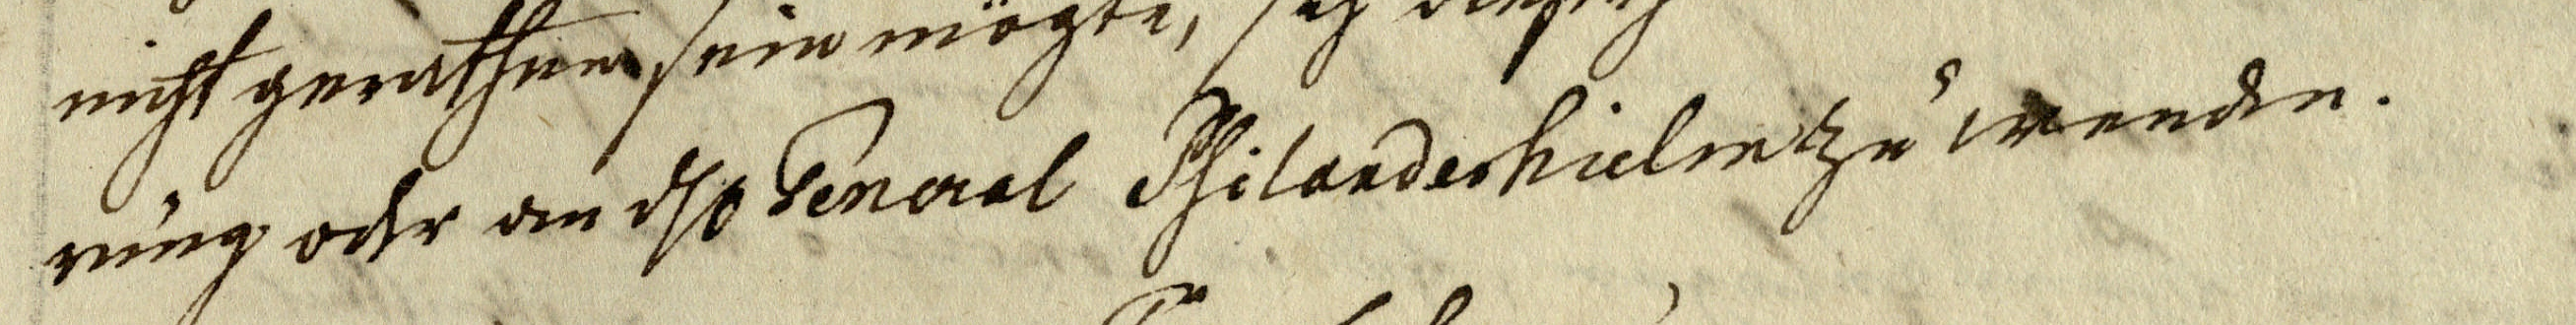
rung oder an dh General Philanderhielm zu wenden.
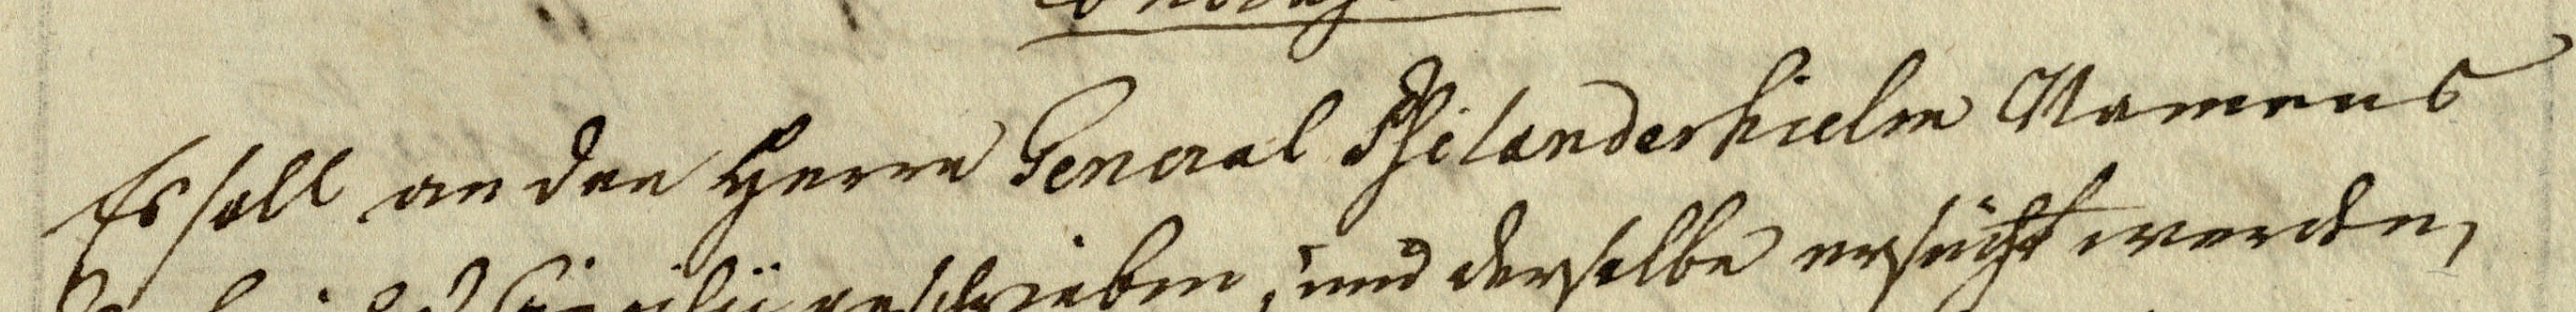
Es soll an den Herrn General Philanderhielm Namens
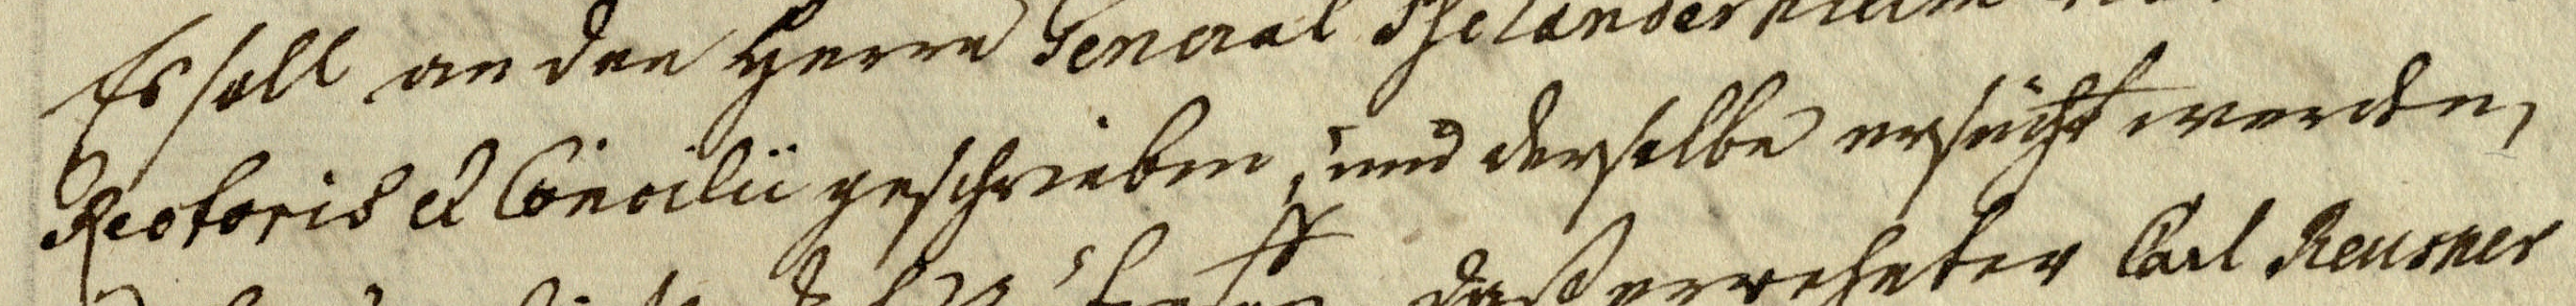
Rectoris et Concilii geschrieben, und derselbe ersucht werden,
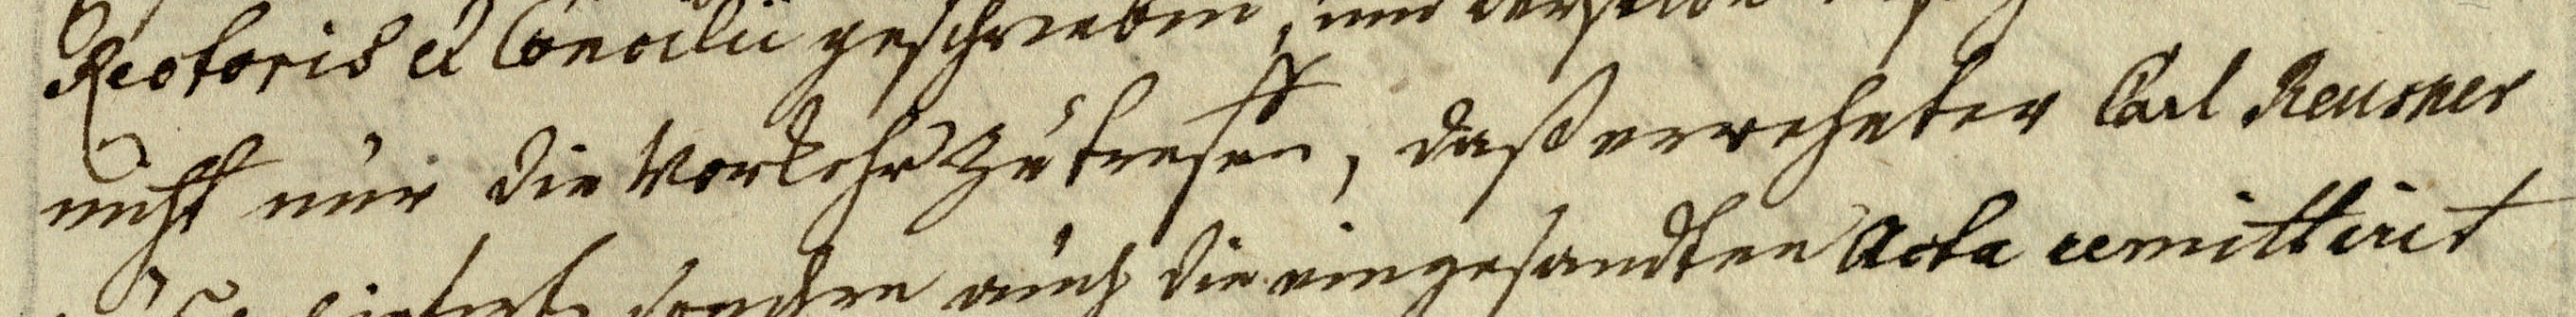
nicht nur die Vorkehr zu treffen, daß erwehnter Carl Reusner
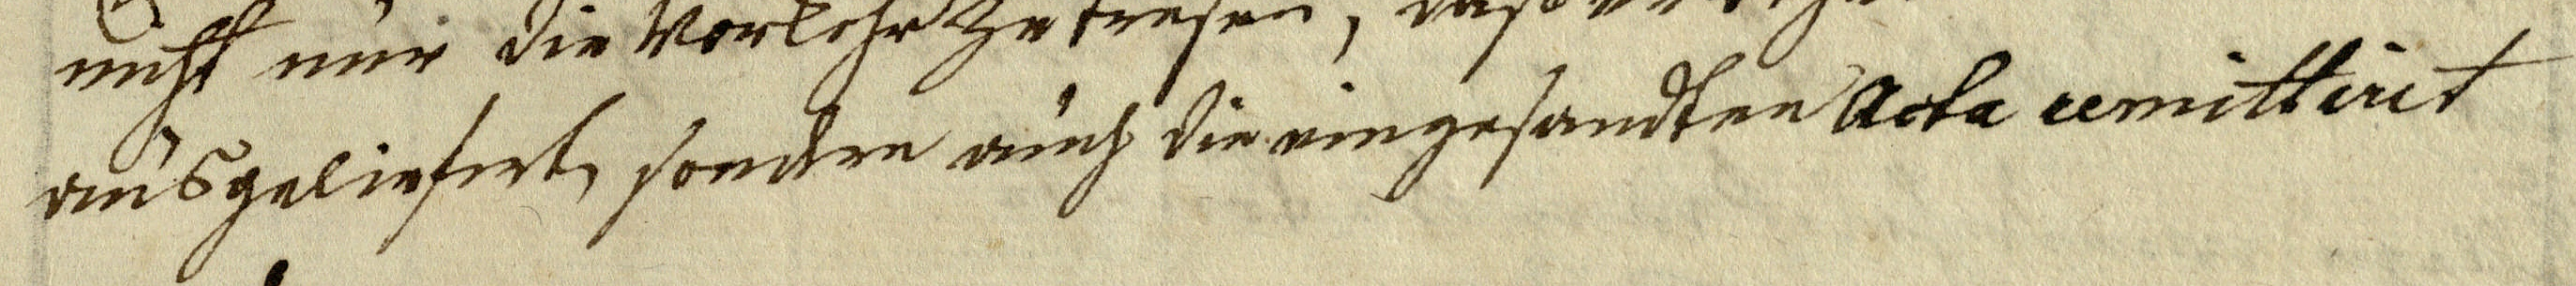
ausgeliefert, sondern auch die eingesandten Acta remittiret
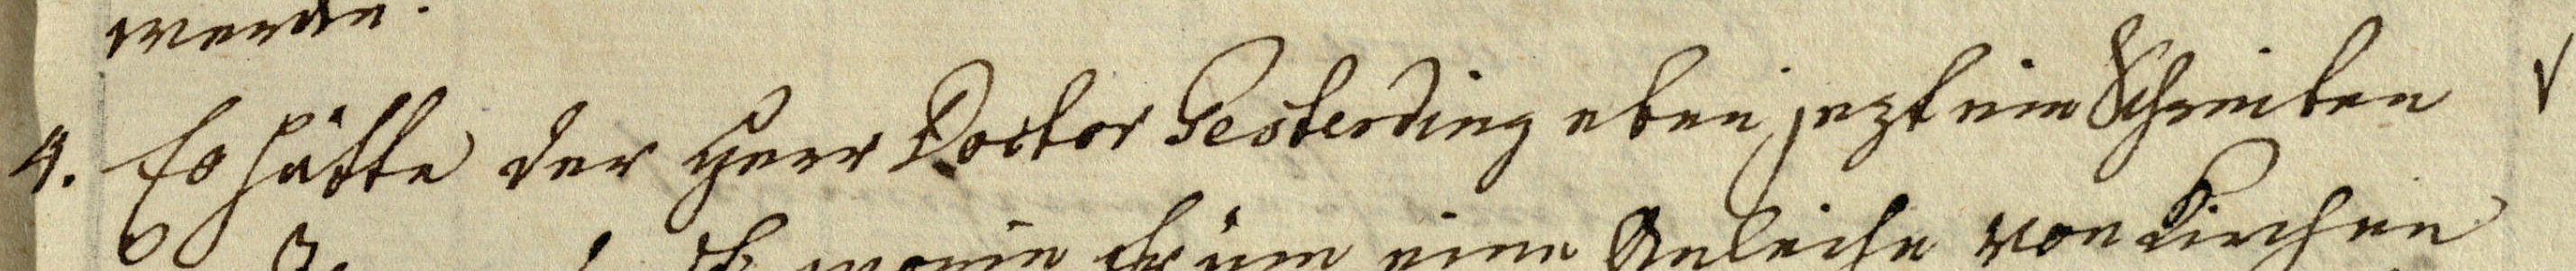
4. Es hätte der Herr Doctor Gesterding eben jezt ein Schreiben
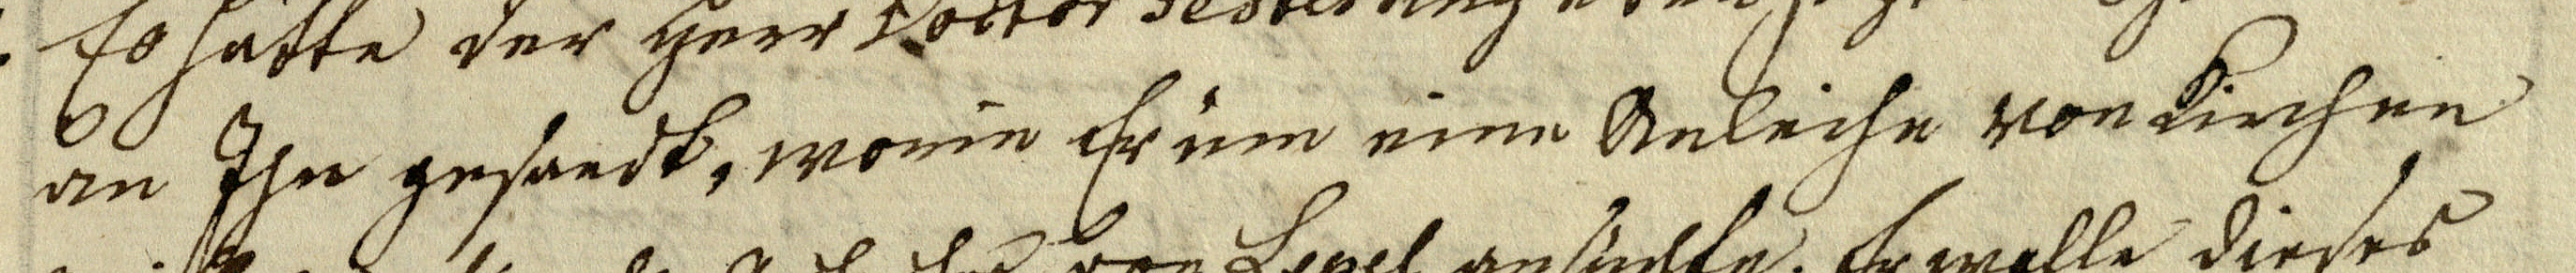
an Ihn gesandt, worin er um eine Anleihe von Kirchen
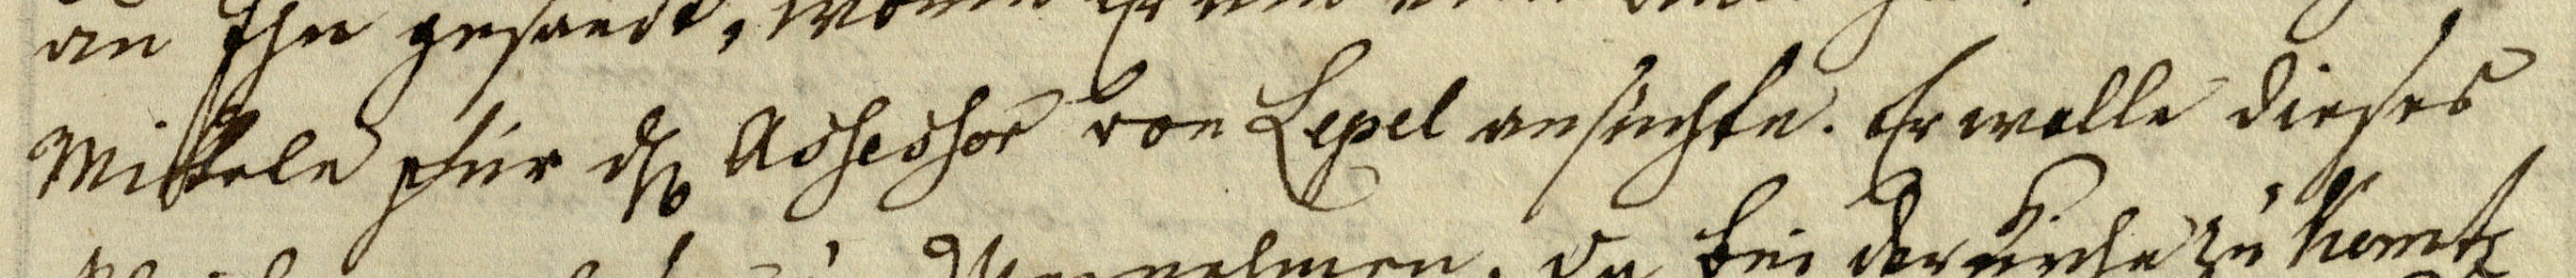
Mitteln für dh Assessor von Lepel ansuchte. Er wolle dieses
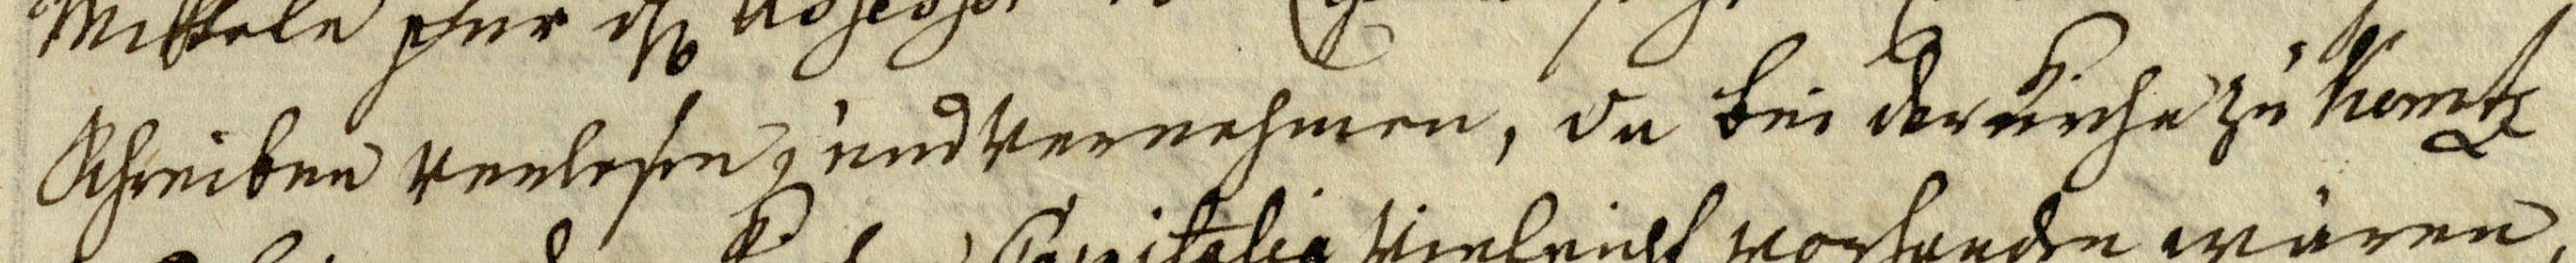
Schreiben verlesen und vernehmen, da bei der Kirche zu Kemtz
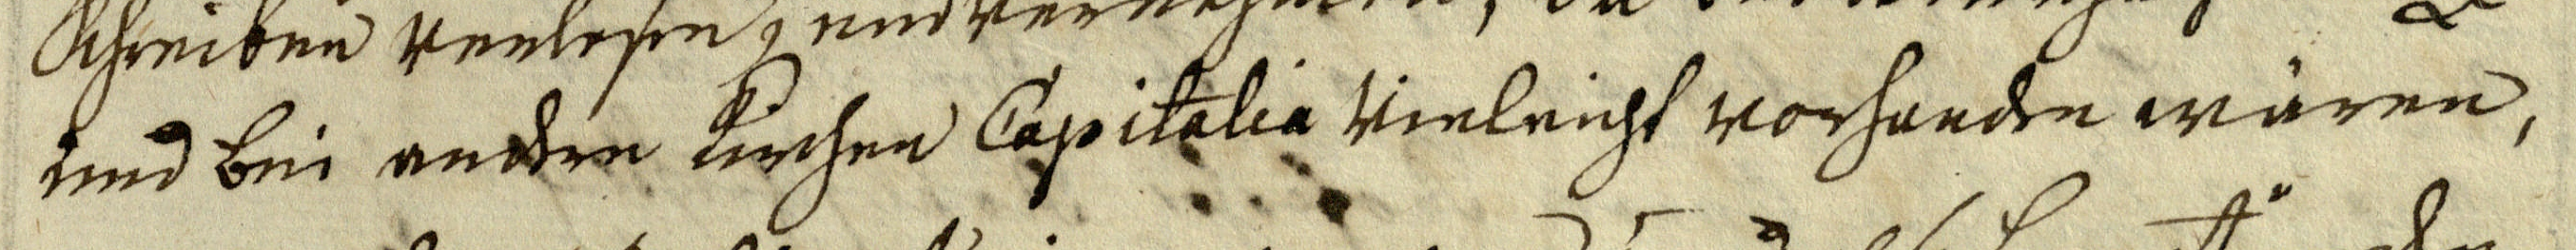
und bei andern Kirchen Capitalia vieleicht vorhanden wären,
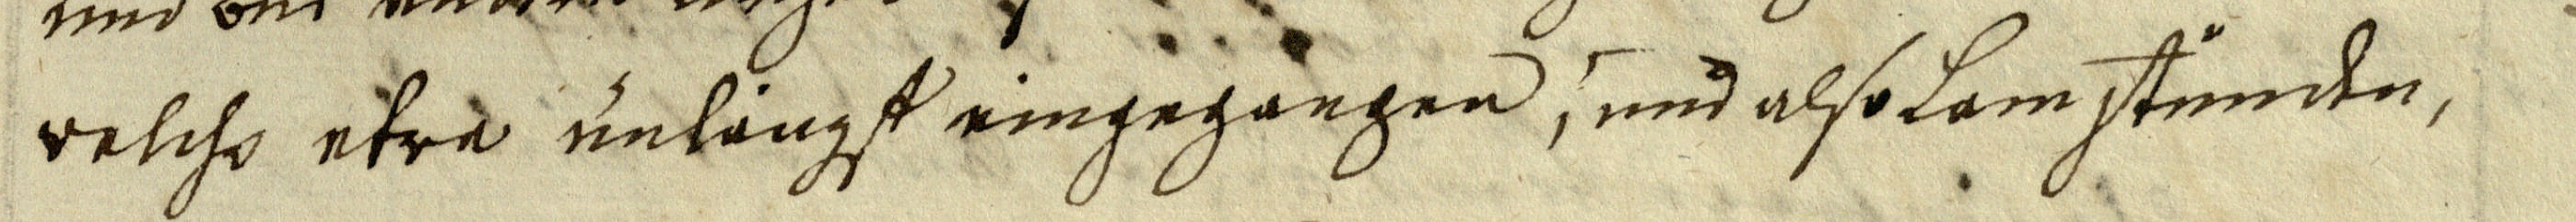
welche etwa unlängst eingegangen, und also lam stünden,
